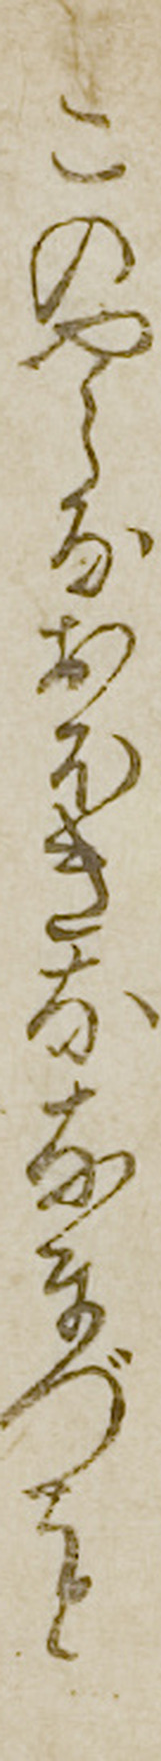このやうなおほきななまづを
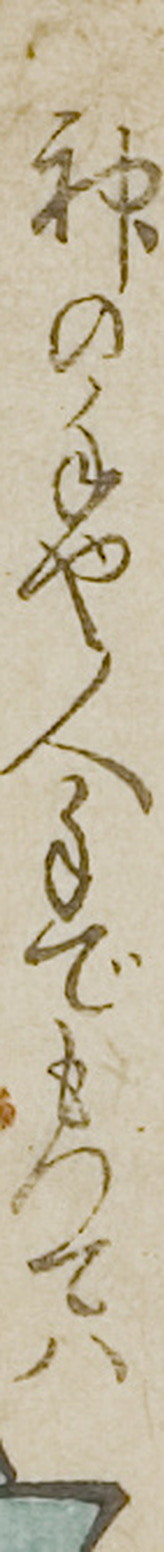神の手や人手でもつては
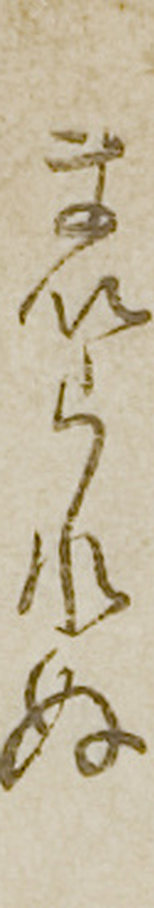まいられぬ
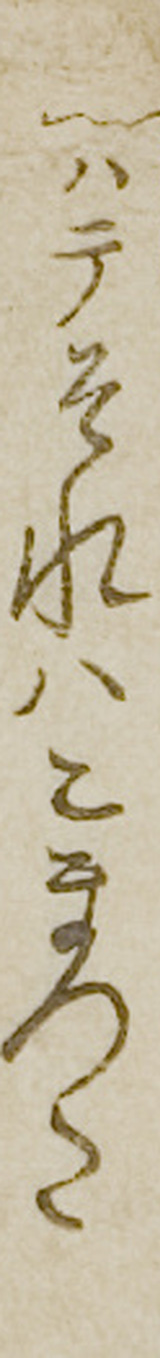乁ハテそれはこまつた
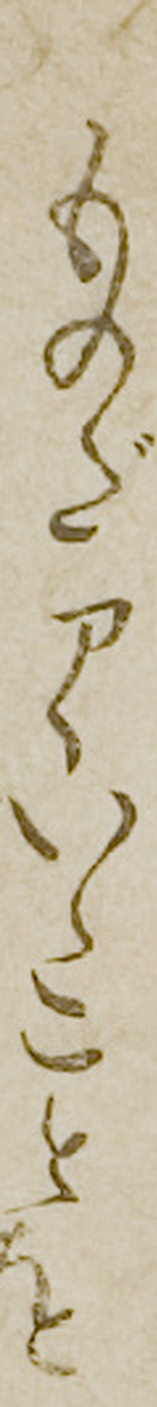ものだアヽいゝことを
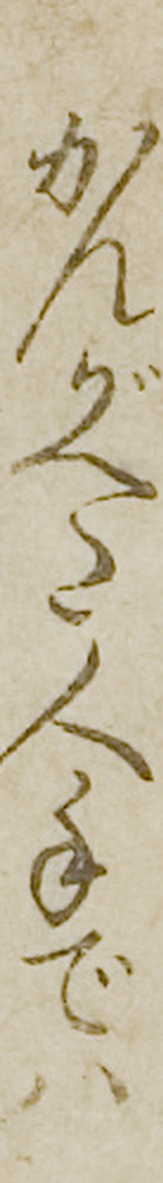かんがへた人手では
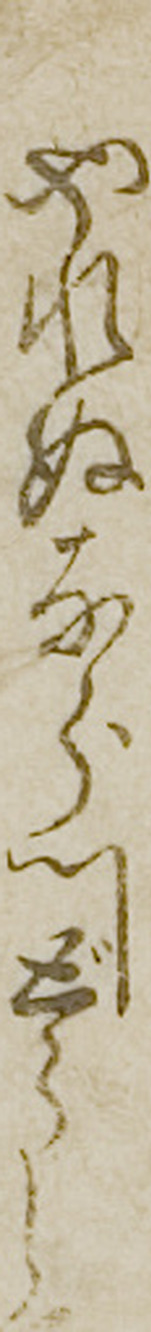やれぬなら「どうして
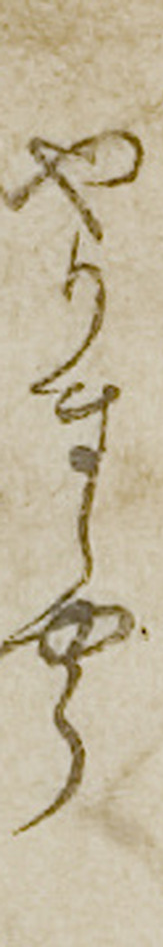やりましやう
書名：[鯰を押える恵比寿]
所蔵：東京大学総合図書館 General Library in the University of Tokyo, JAPAN
